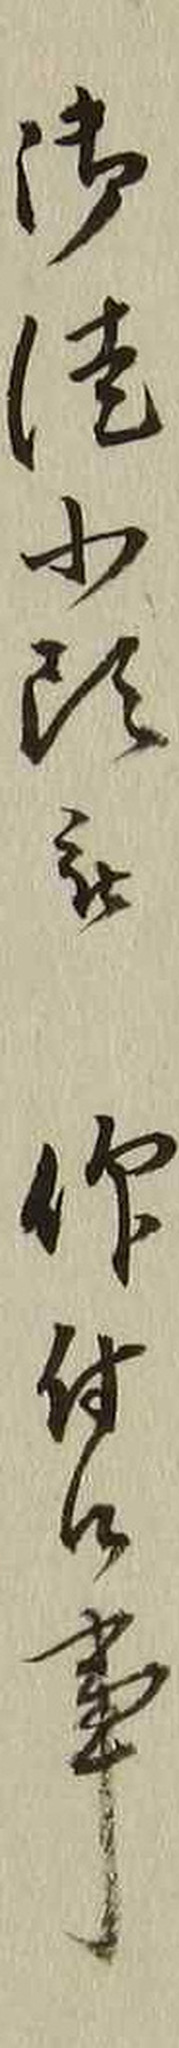御徒小頭被仰付候事
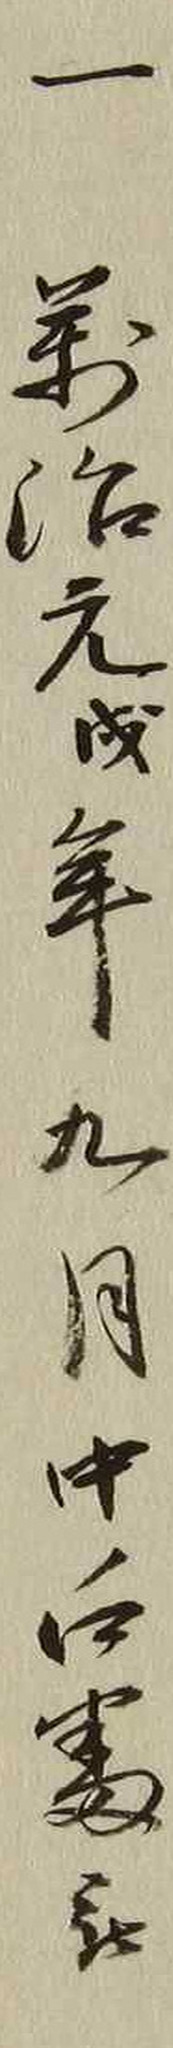一万治元戌年九月中ノ口番被
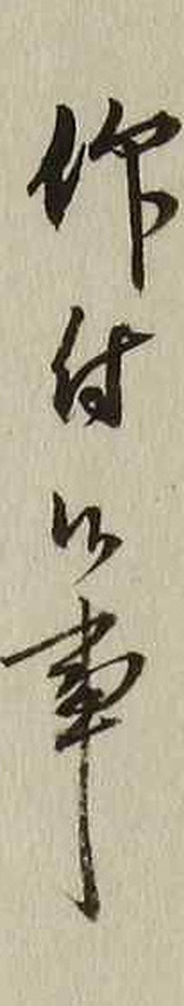仰付候事
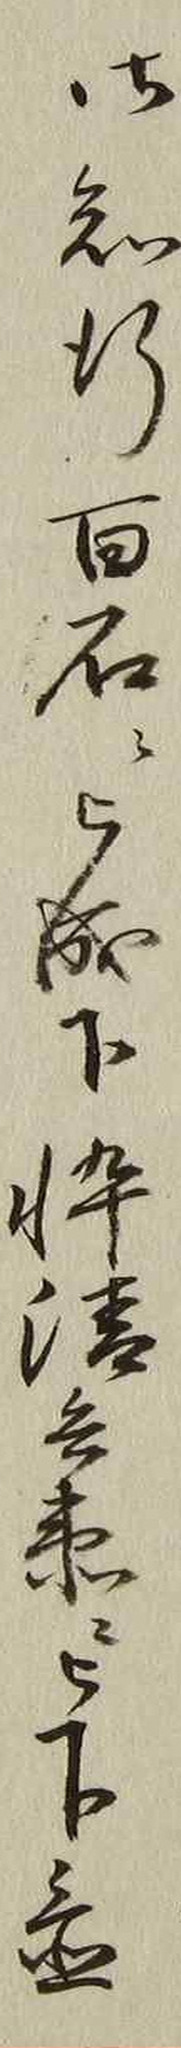御知行百石ニ被成下忰清兵衛ニ被下置
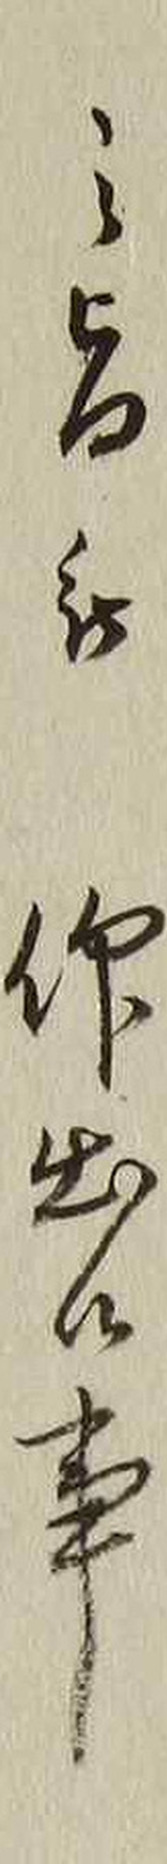之旨被仰出候事
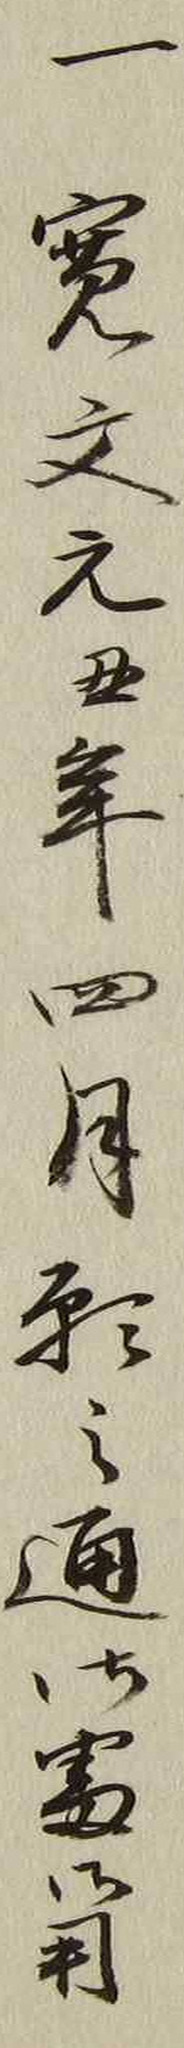一寛文元丑年四月願之通御番御用
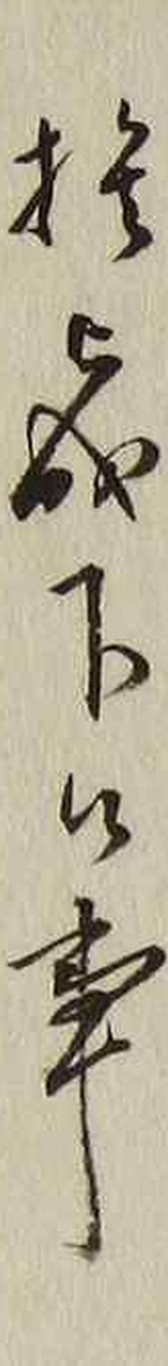於被成下候事
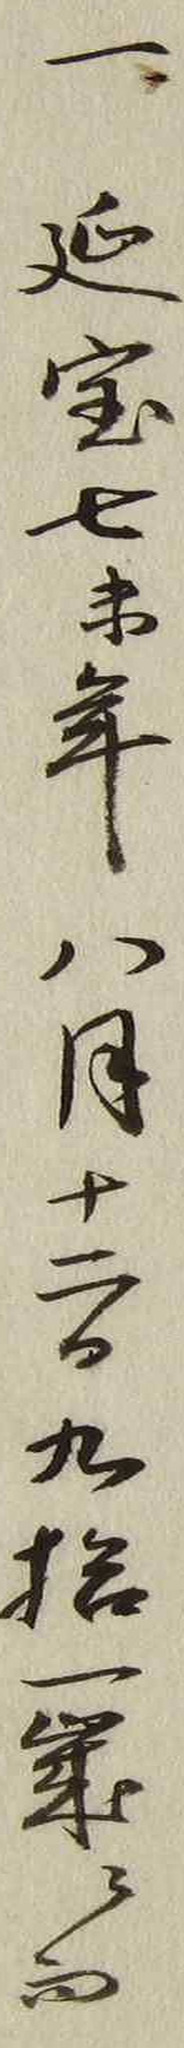一延宝七未年八月十二日九拾一歳ニ而
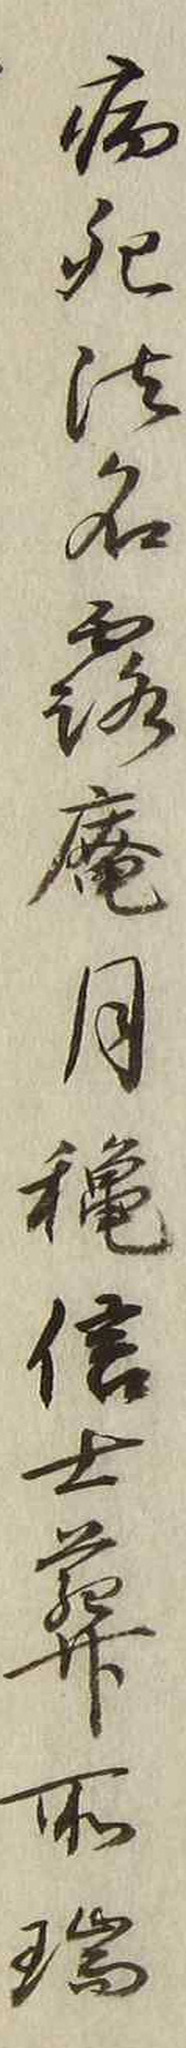病死法名露庵月穐信士葬所瑞
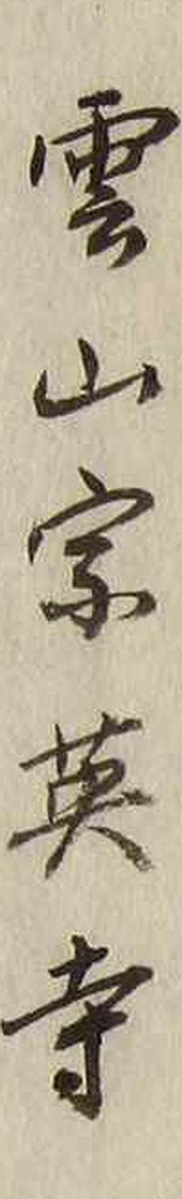雲山宗英寺

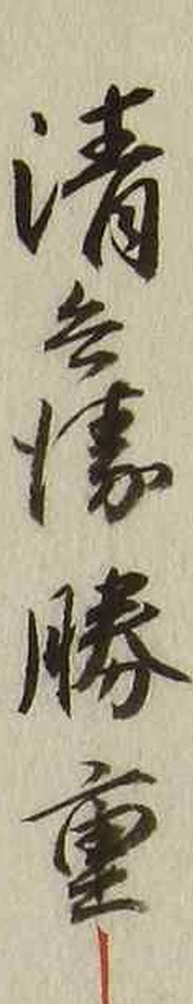清兵衛勝重
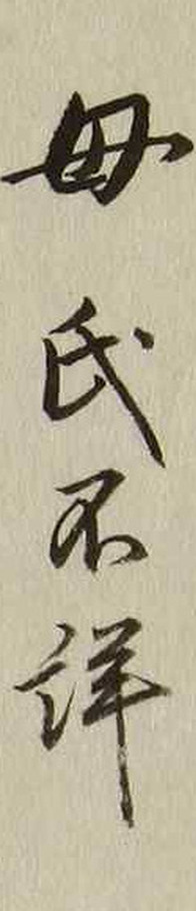母氏不詳
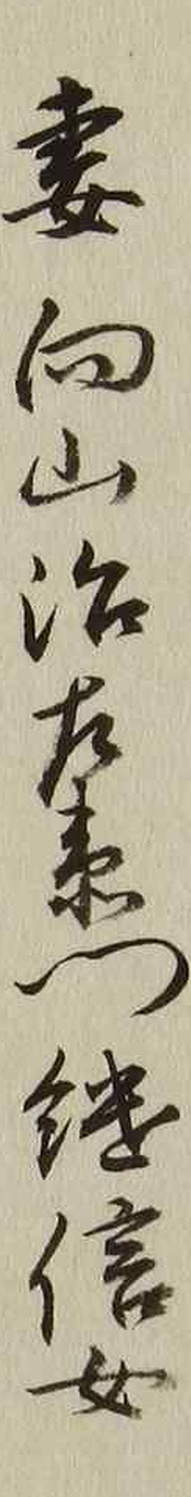妻向山治左衛門継信女
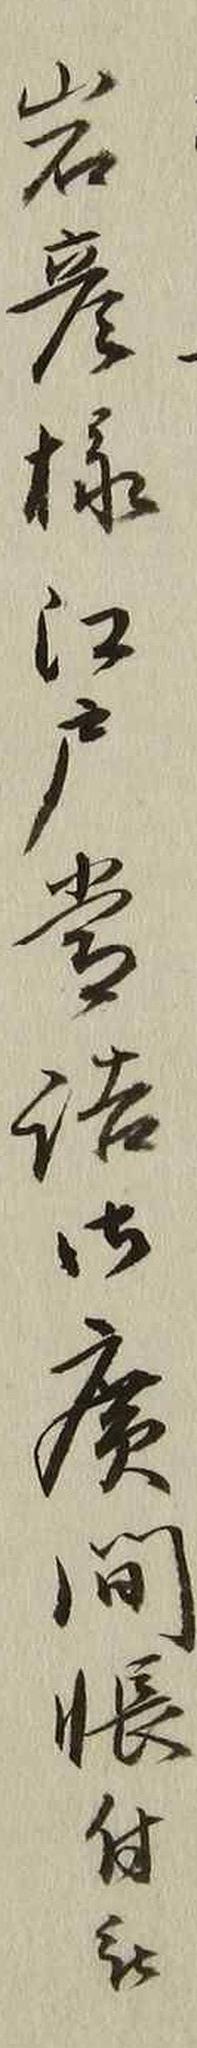岩彦様江戸常詰御広間帳付被
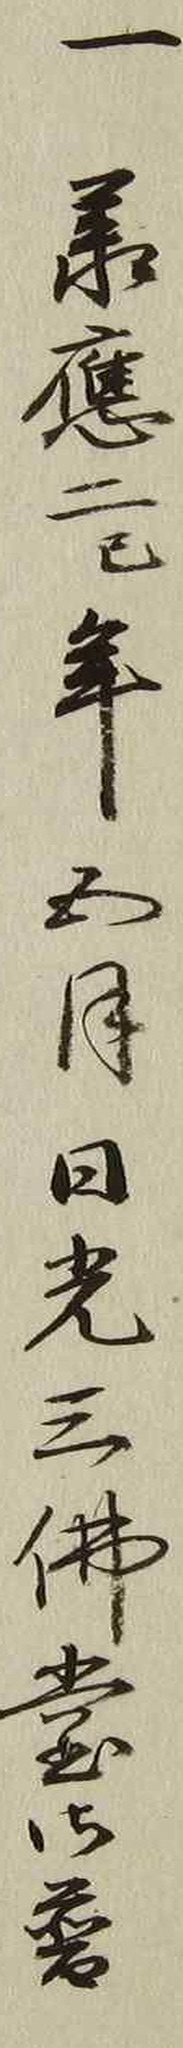一承応二巳年五月日光三仏堂御普
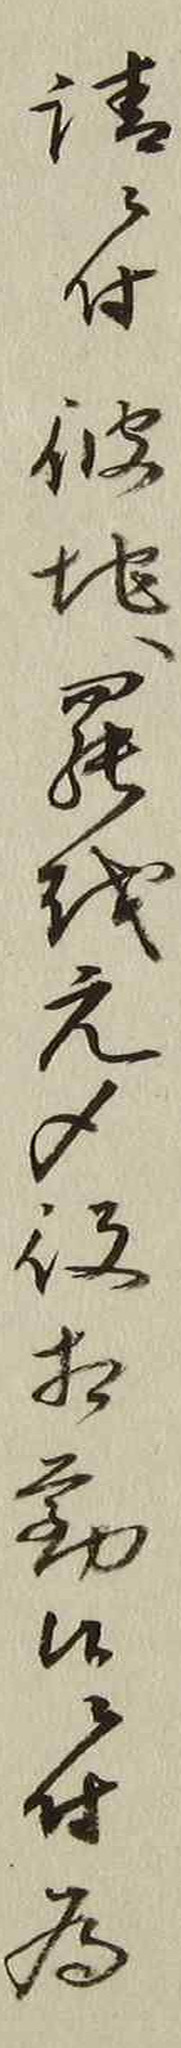請ニ付彼地へ罷越元〆役相勤候ニ付為
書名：諸士系譜　巻之128　た之部4
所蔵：会津若松市立会津図書館
